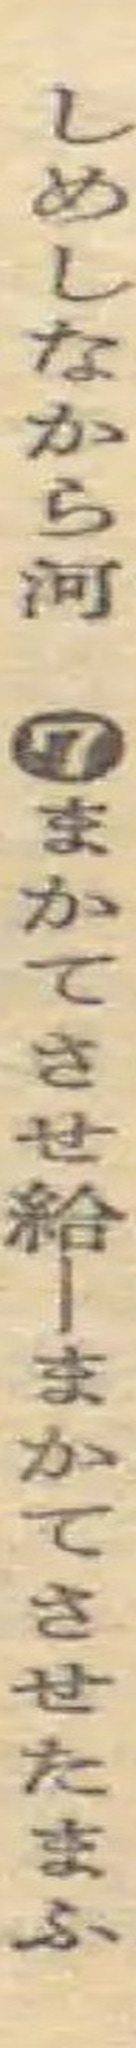しめしなから河❼まかてさせ給―まかてさせたまふ
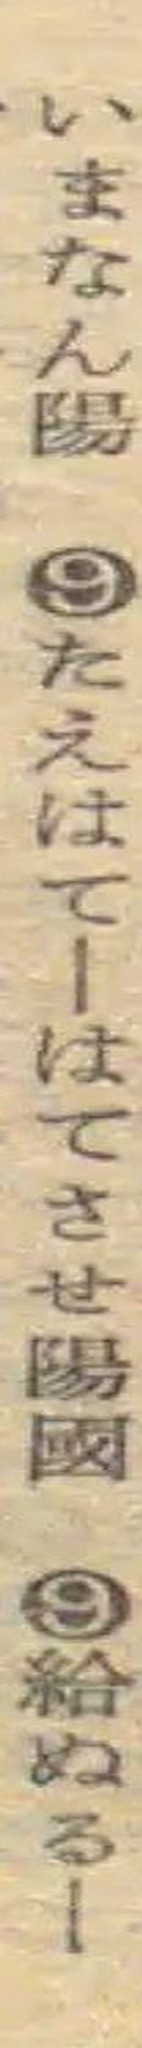いまなん陽❾たえはて―はてさせ陽国❾給ぬる―
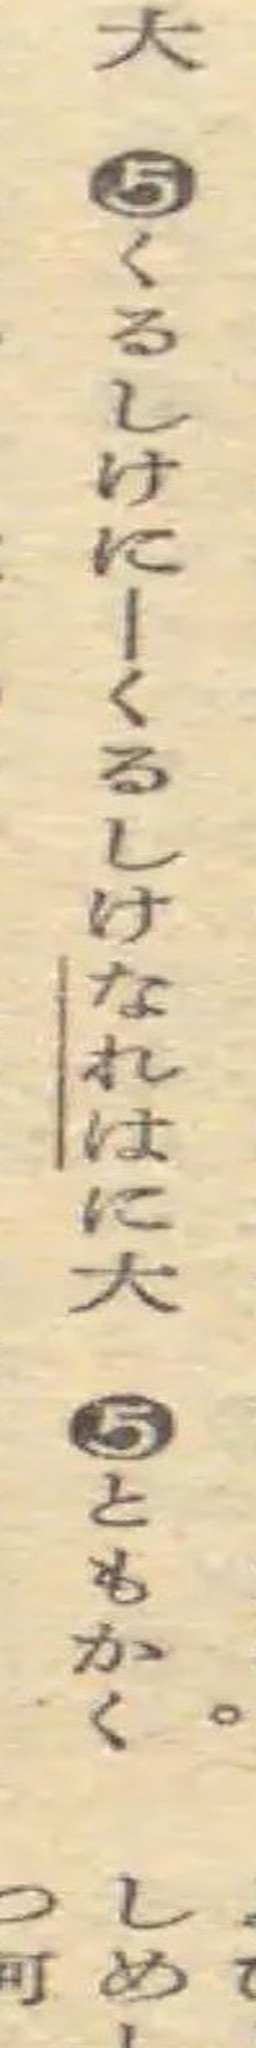大❺くるしけに―くるしけなれはに大❺ともかく
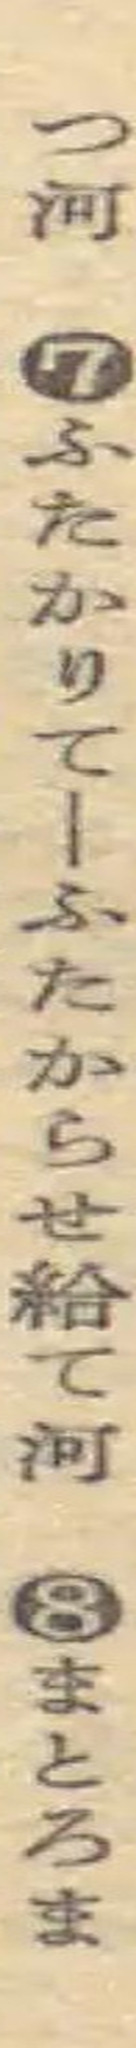つ河❼ふたかりて―ふたからせ給て河❽まとろま
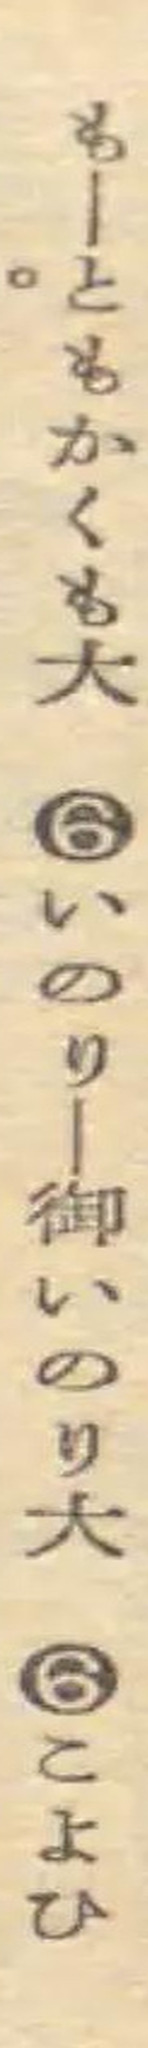も―ともかくも大❻いのり―御いのり大こよひ
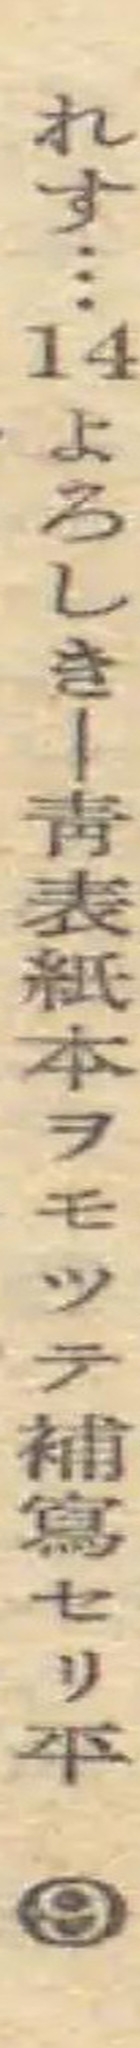れす…よろしき―青表紙本ヲモツテ補写セリ平❾
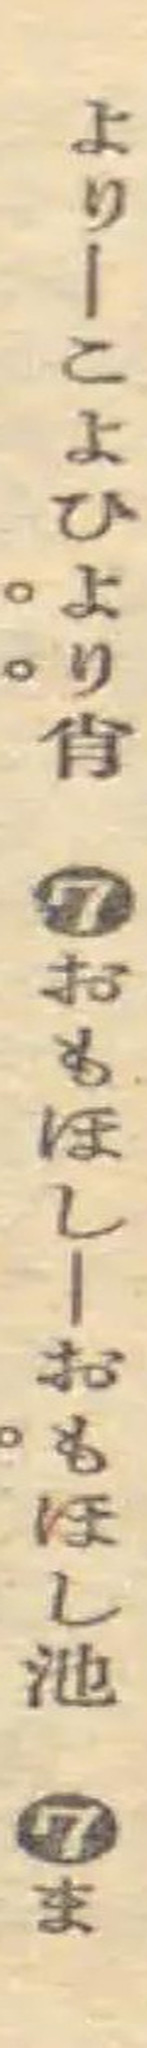より―こよひより肖❼おもほし―おもほし池❼ま
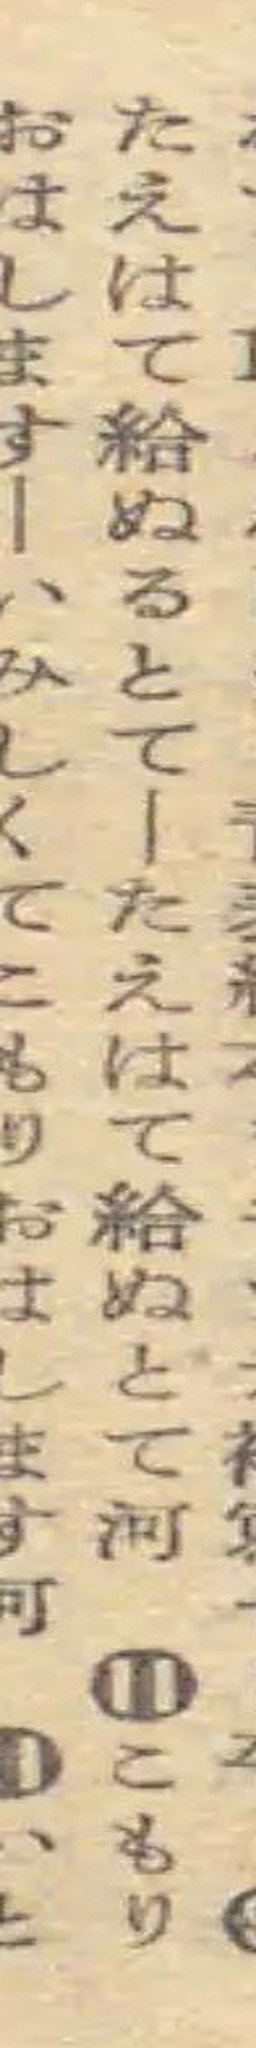おはします―いみしくてこもりおはします河⓫いと
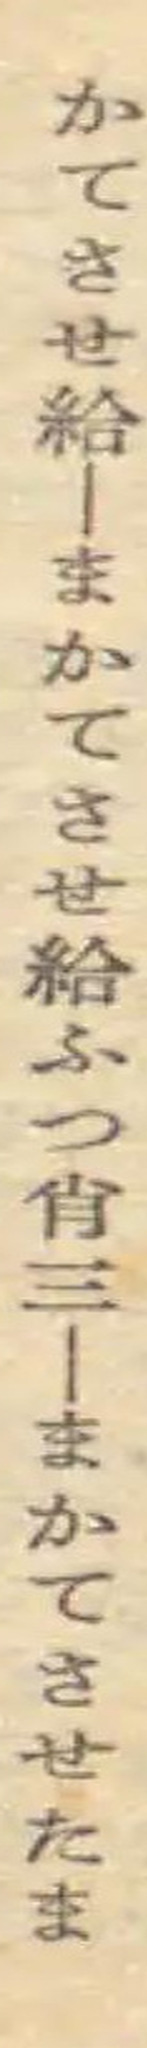かてさせ給―まかてさせ給ふつ肖三―まかてさせたま
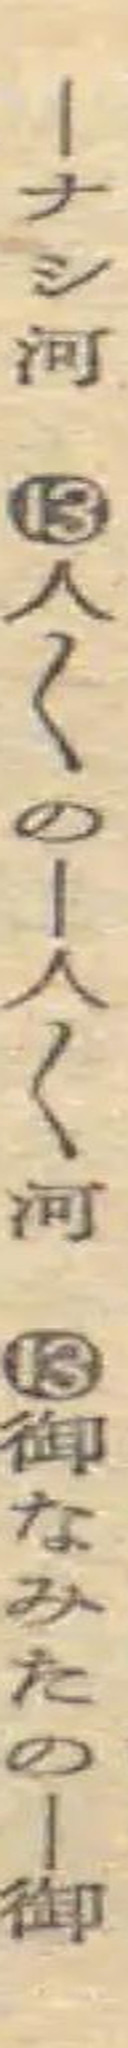―ナシ河⓭人〳〵の―人〳〵河⓭御なみたの―御
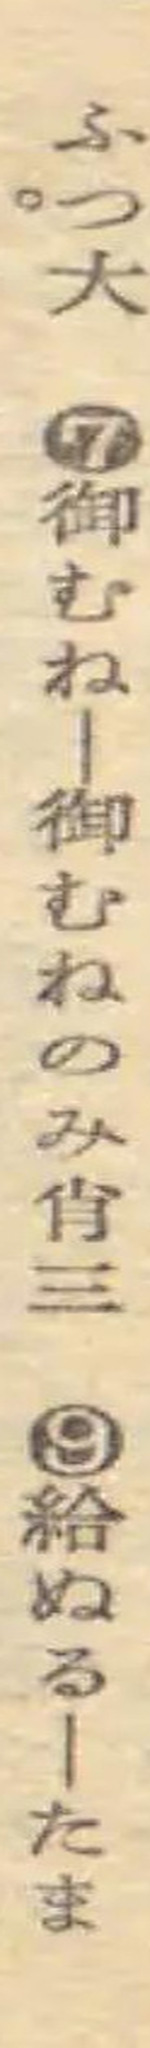ふつ大❼御むね―御むねのみ肖三❾給ぬる―たま
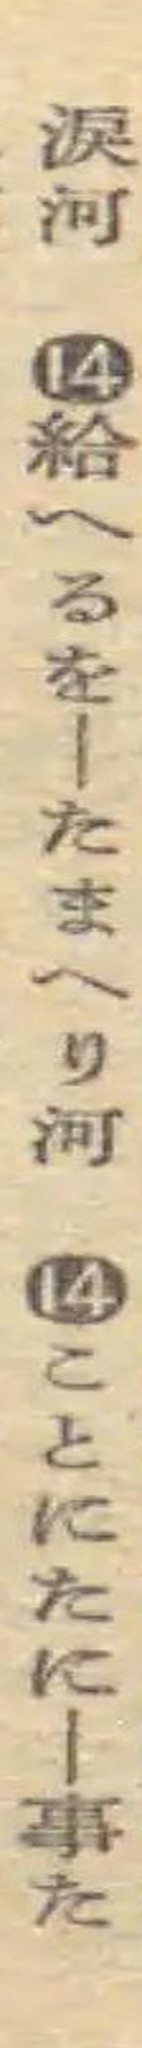涙河⓮給へるを―たまへり河⓮ことにたに―事た
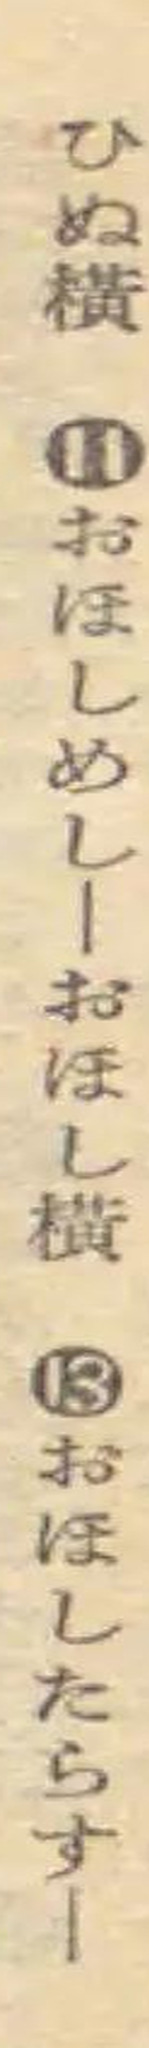ひぬ横⓫おほしめし―おほし横⓭おほしたらす―
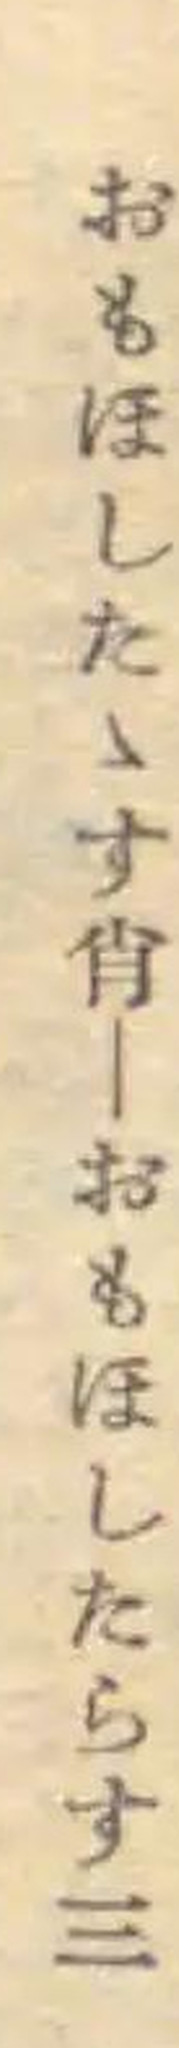おものしたゝす肖―おもほしたらす三
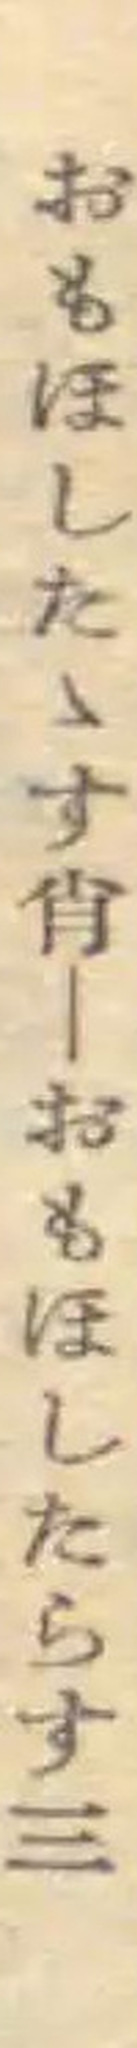おものしたゝす肖―おもほしたらす三
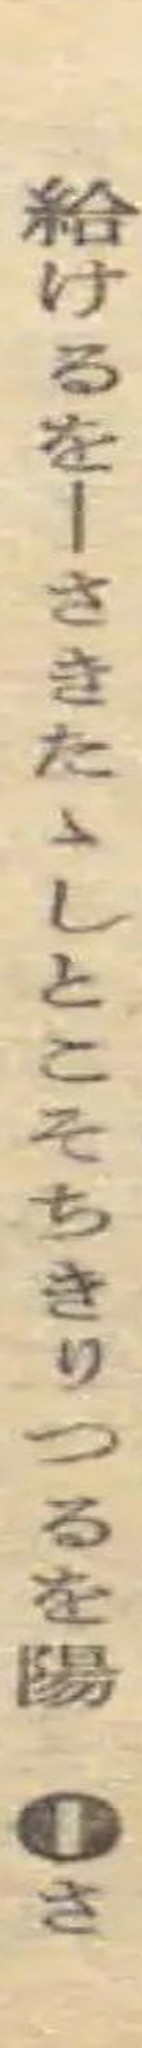給けるを―さきたゝしとこそちきりつるを陽➊さ
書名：校異源氏物語.
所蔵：国立国会図書館 National Diet Library, JAPAN
